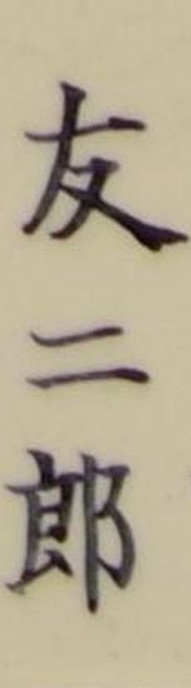友二郎
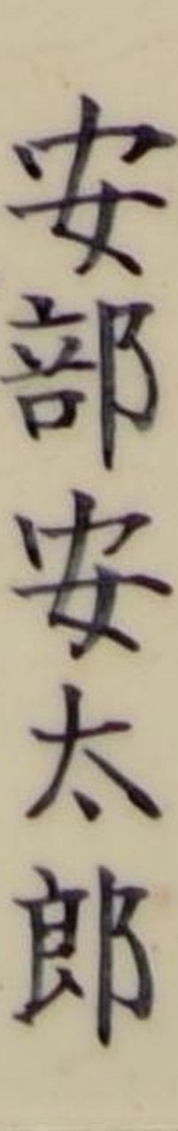安部安太郎
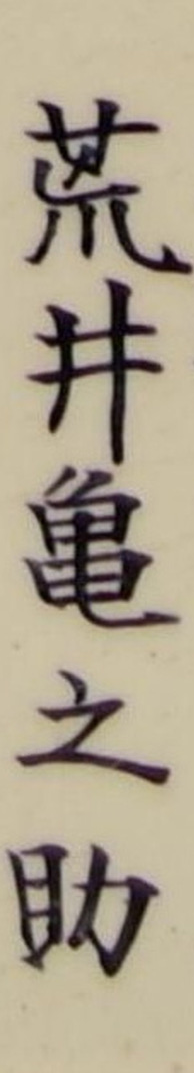荒井亀之助
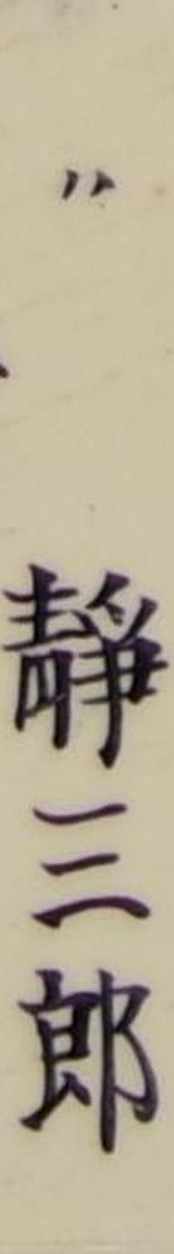静三郎
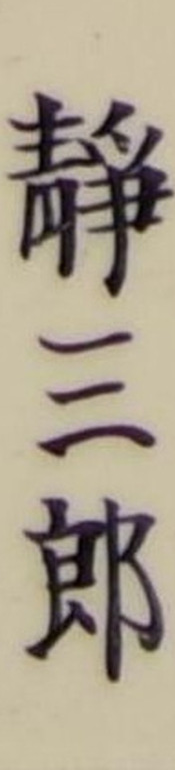静三郎
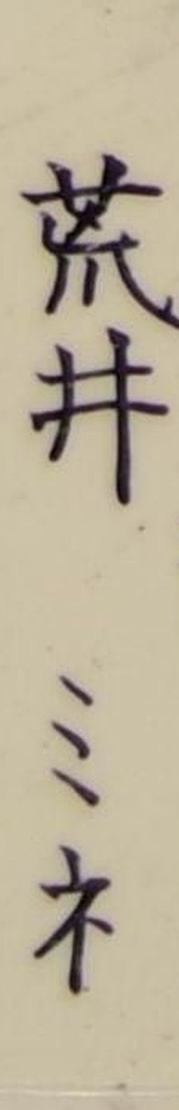荒井ミネ
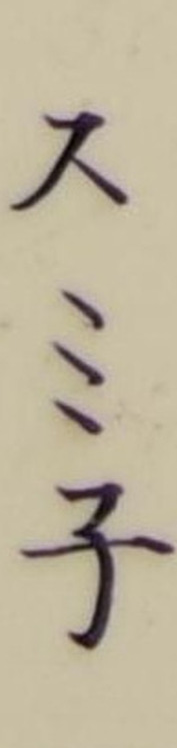スミ子
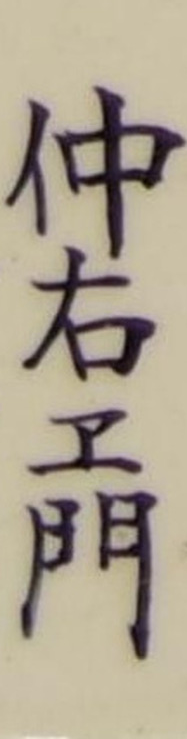仲右衛門
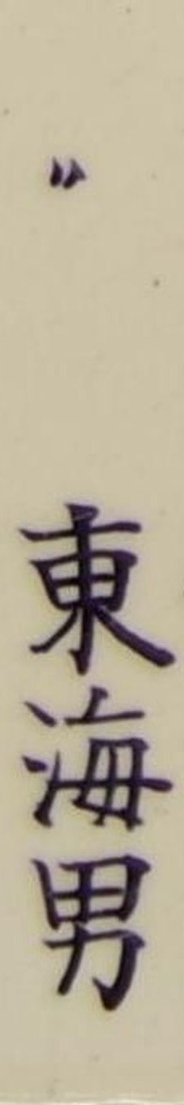東海男
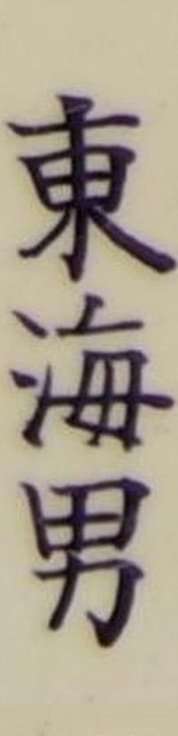東海男

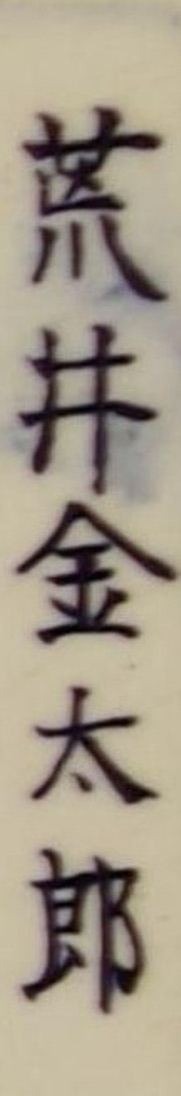荒井金太郎
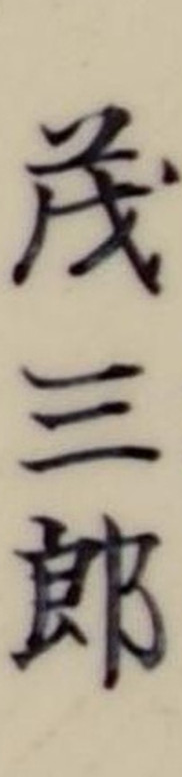茂三郎
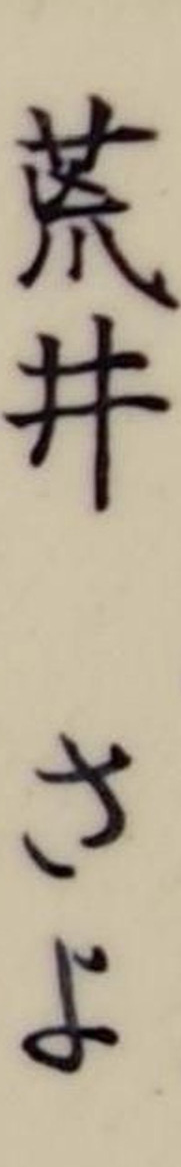荒井さよ
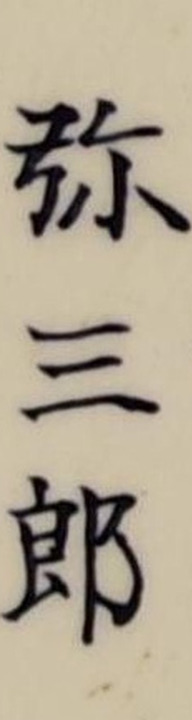弥三郎
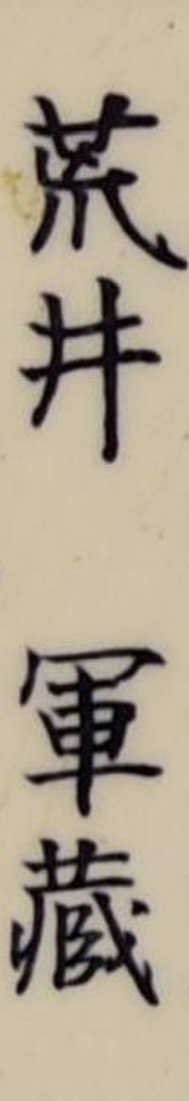荒井軍蔵
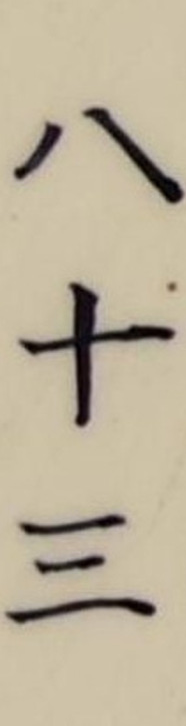八十三
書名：A~D
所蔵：koyasan kongobuji
